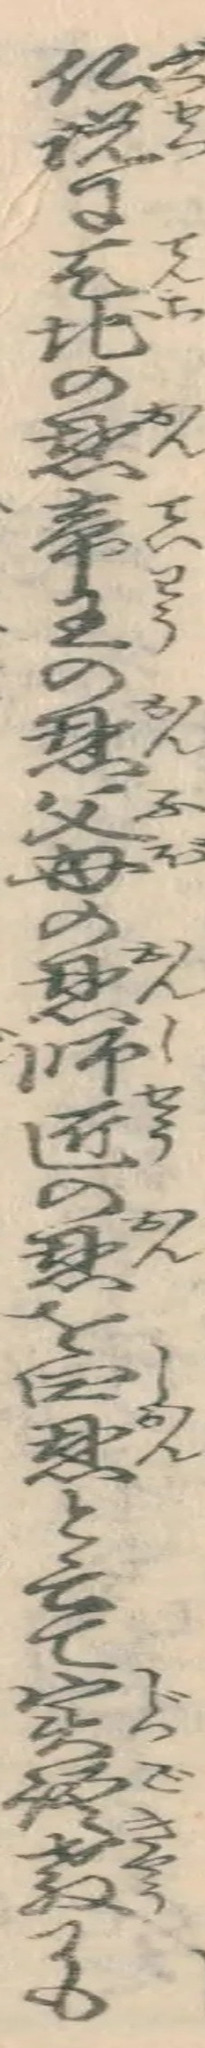仏説に天地の恩帝王の恩父母の恩師匠の恩を四恩と云て実語教にも
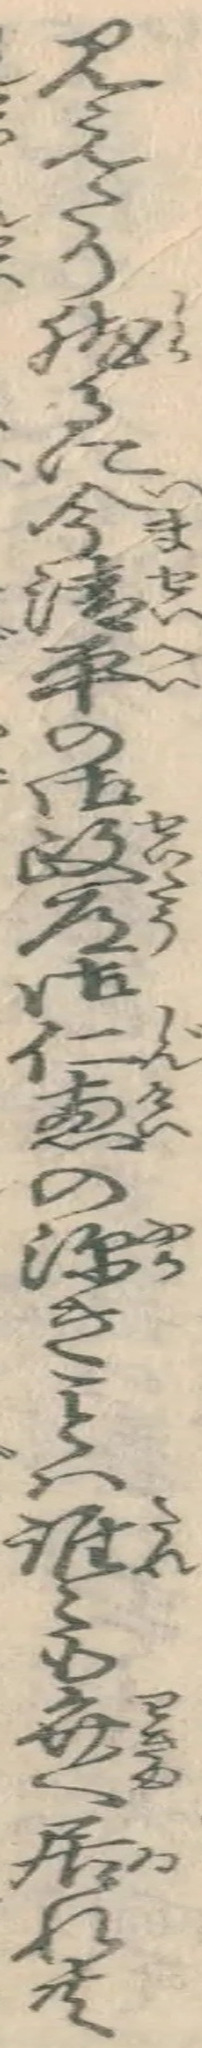見えたり然るに今清平の御政道御仁恵の深きことは誰にも弁へ居れ共
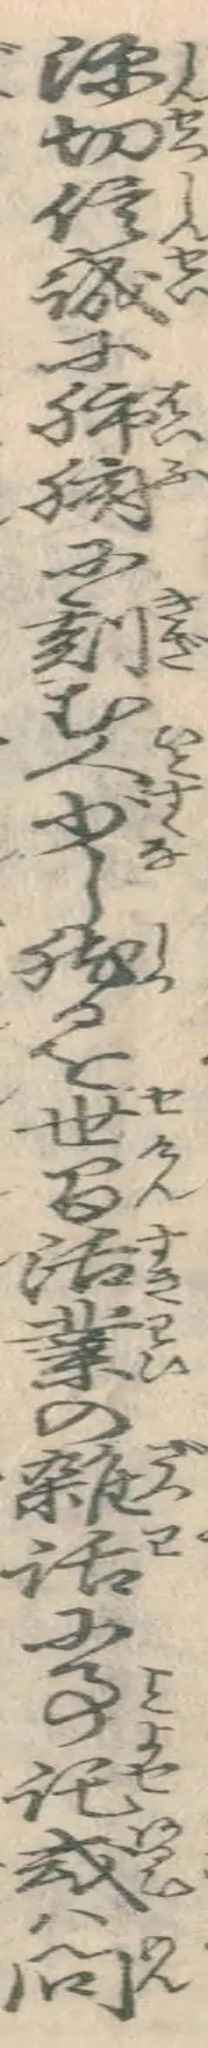深切信誠に肺腑に刻む人少し然るを世間活業の雑話に事託或は問
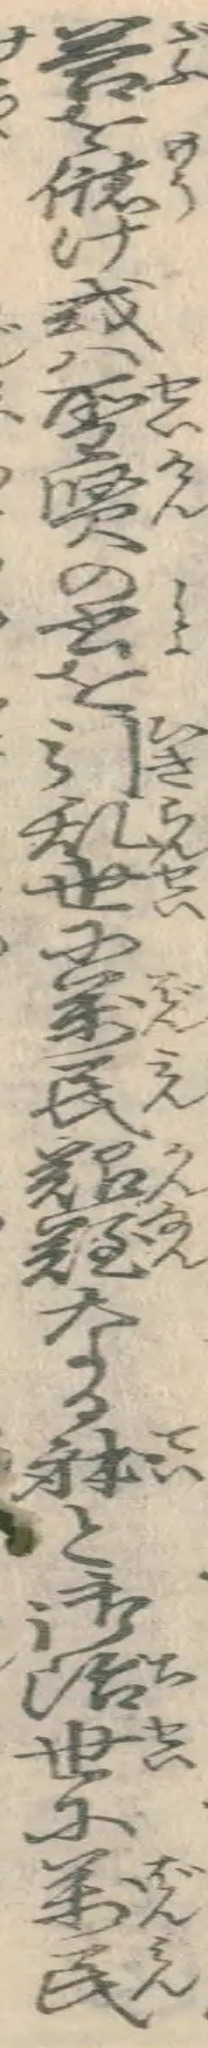答を儲け或は聖賢の書を引乱世に万民艱難なる躰と御治世に万民
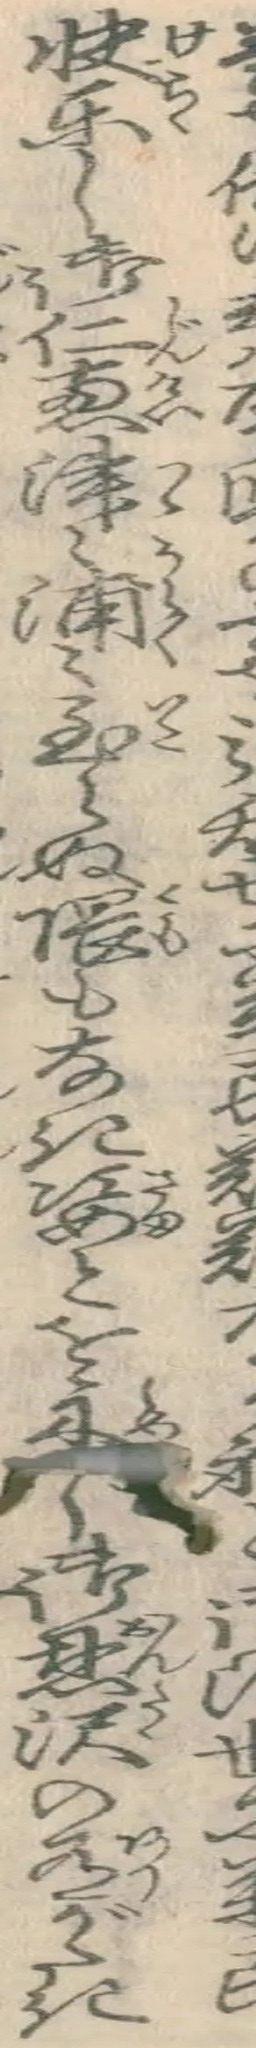快楽し御仁恵津々浦々至らぬ隅もなき姿とを示し御恩沢の有がたき
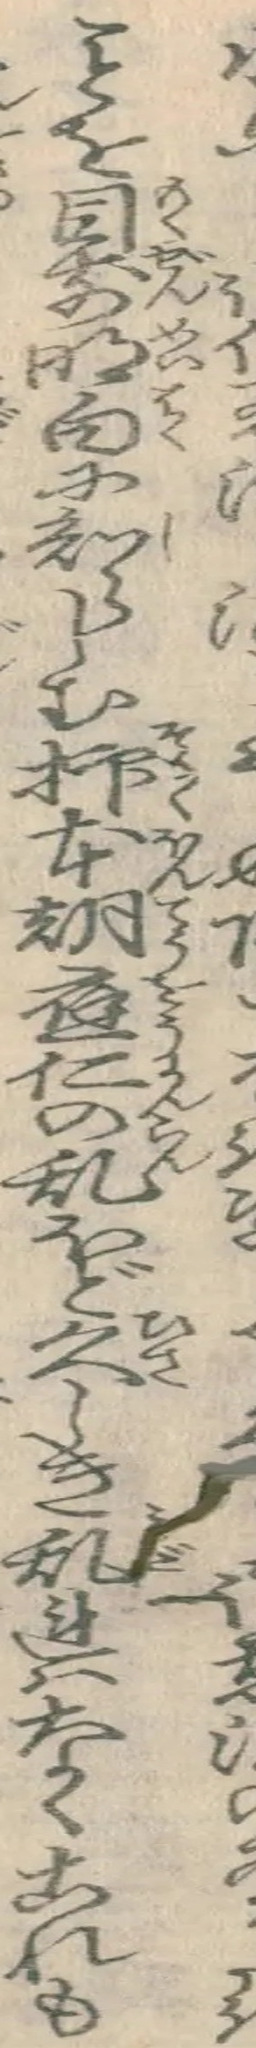ことを目前明白に知らしむ抑本朝応仁の乱ほど久しき乱れはなくこれも
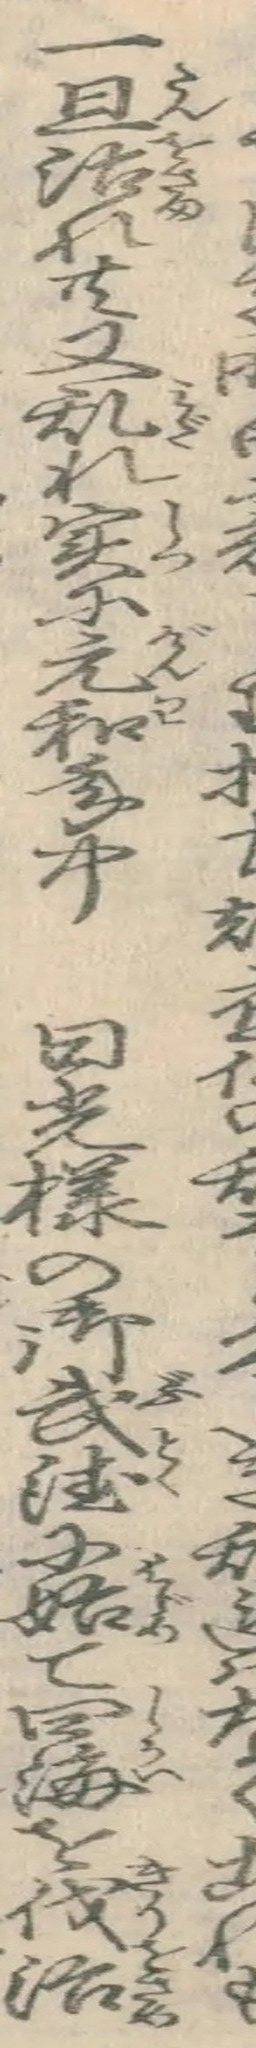一旦治れ共又乱れ実に元和年中日光様の御武徳に始て四海を伐治
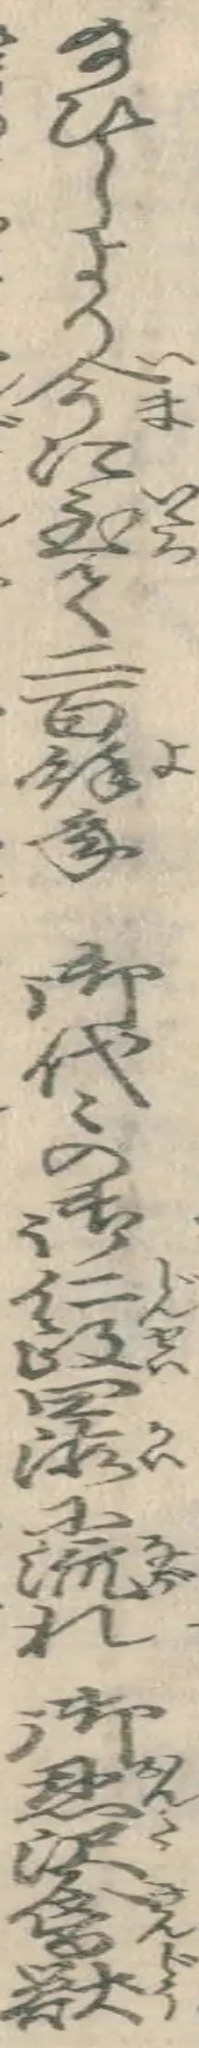給ひしより今に至て二百余年御代々の御仁政四海に流れ御恩沢禽獣
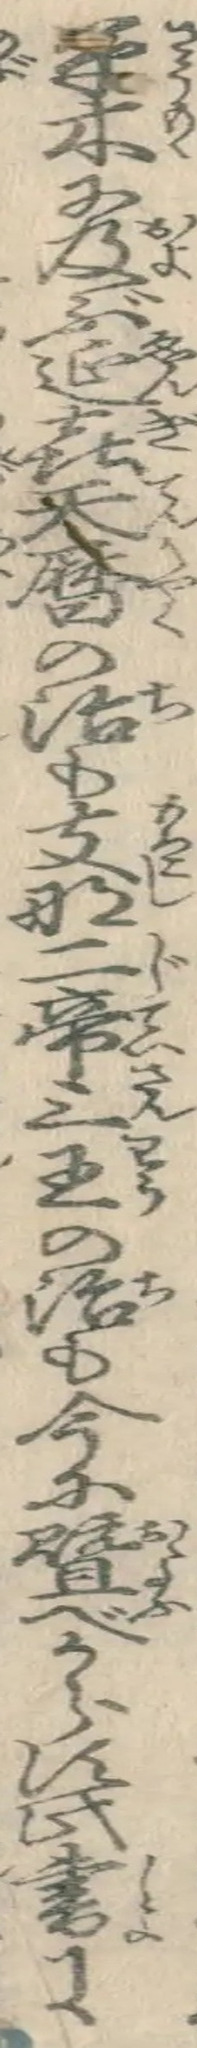草木に及ぶ延喜天暦の治も支那二帝三王の治も今に曁べからす此書に
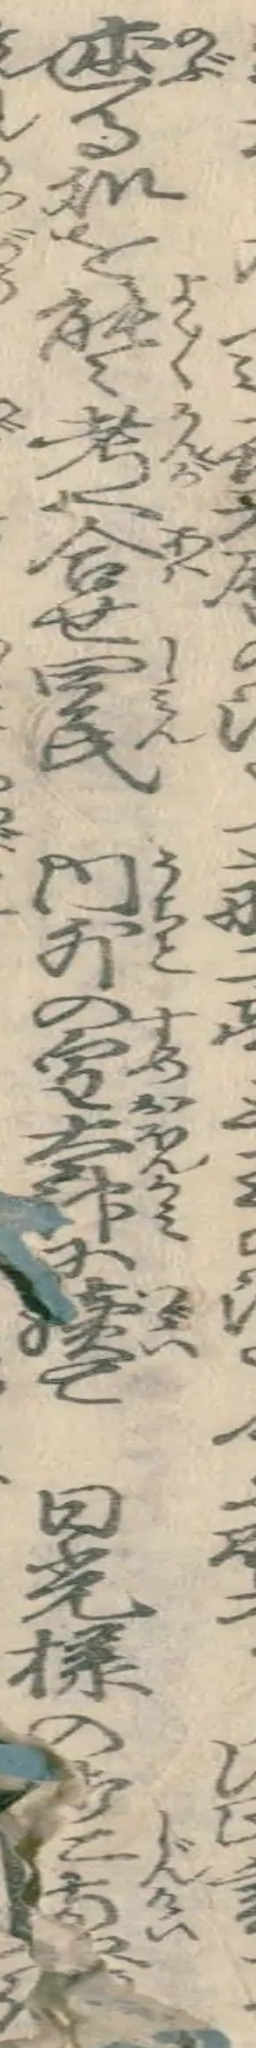述る処を能々考へ合せ四民内外の皇大神に続て日光様の御仁惠を
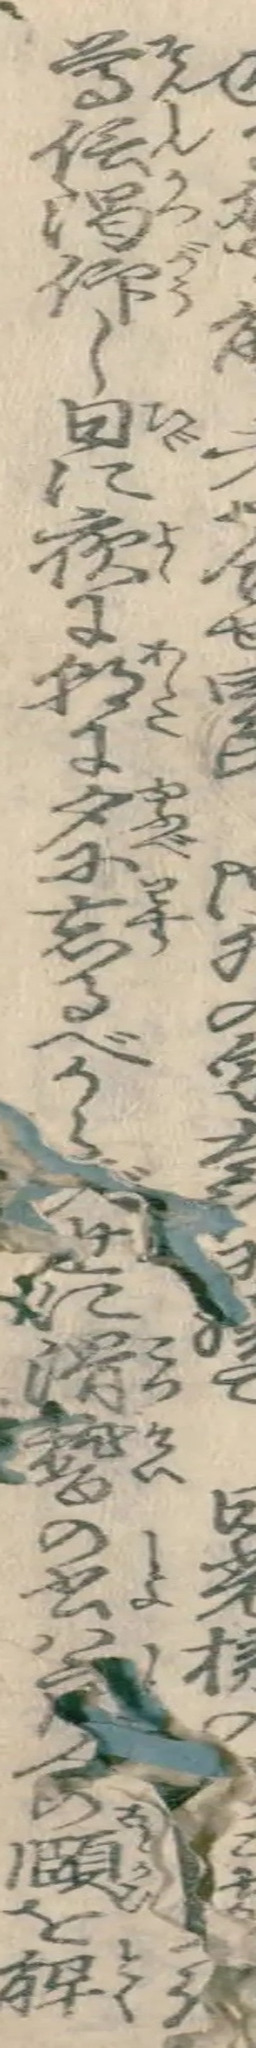尊信渇仰し日に夜に朝に夕に忘るべからず世に滑稽の書は衆人の頤を解

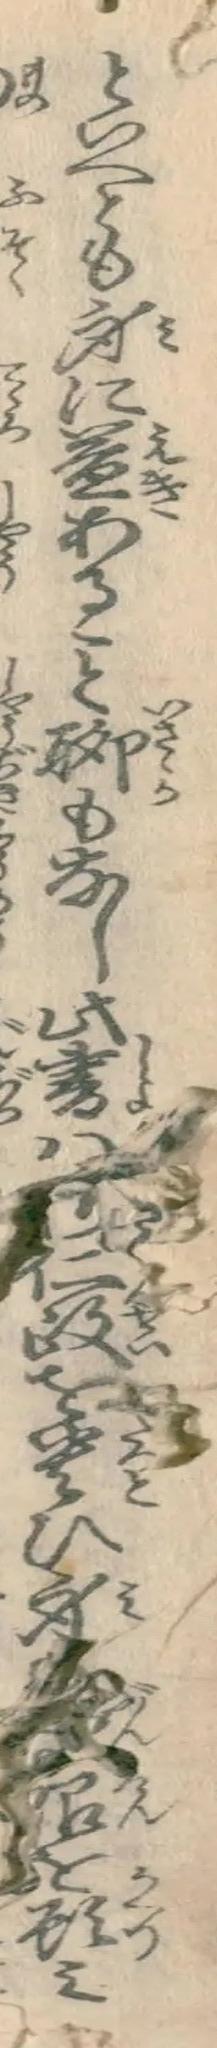といへとも身に益あること聊もなし此書は御仁政を貴ひ身の分限を顧み
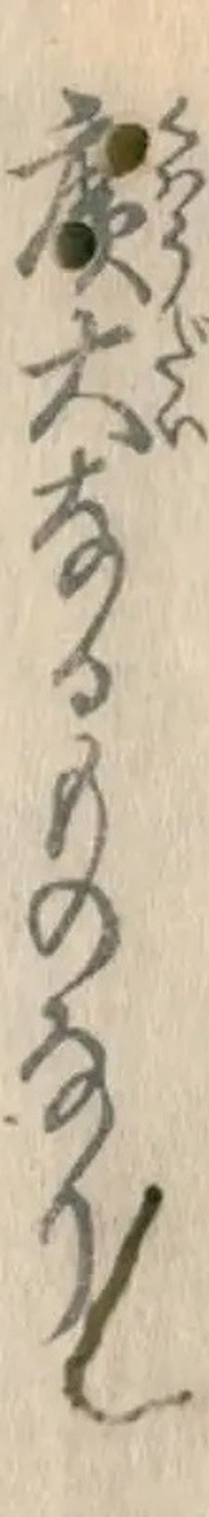広大なるものなり
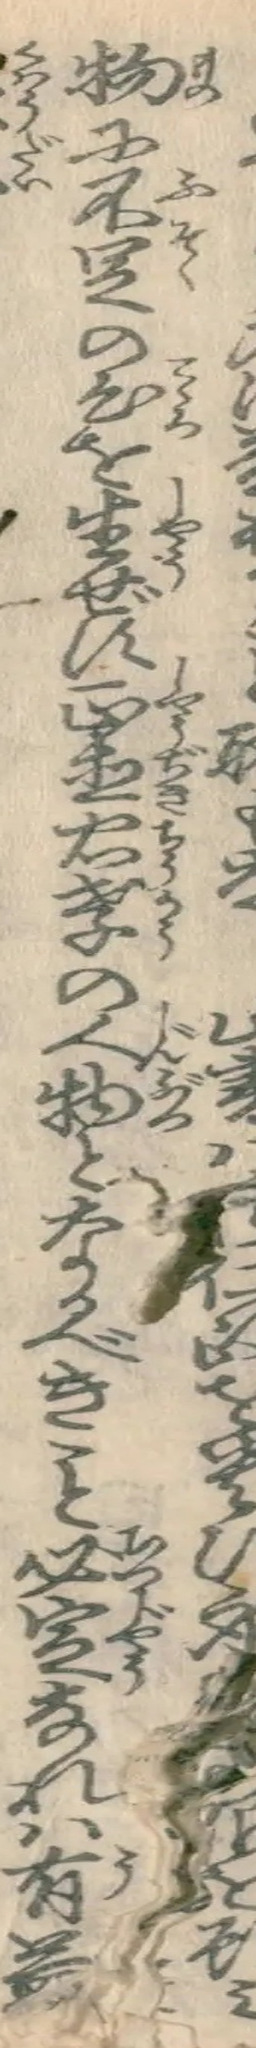物に不足の心を生ぜす正直忠孝の人物となるべきこと必定なれは有益
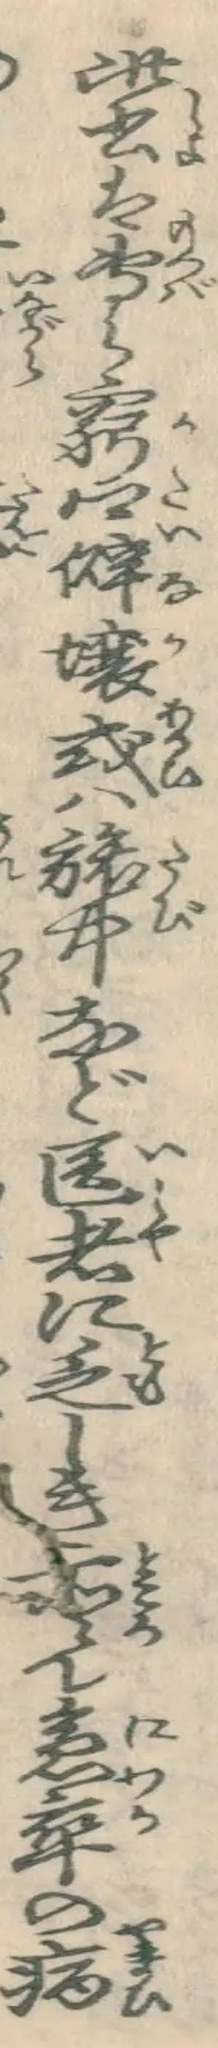此書は専ら窮郷僻壌或は旅中など医者に乏しき所にて急卒の病
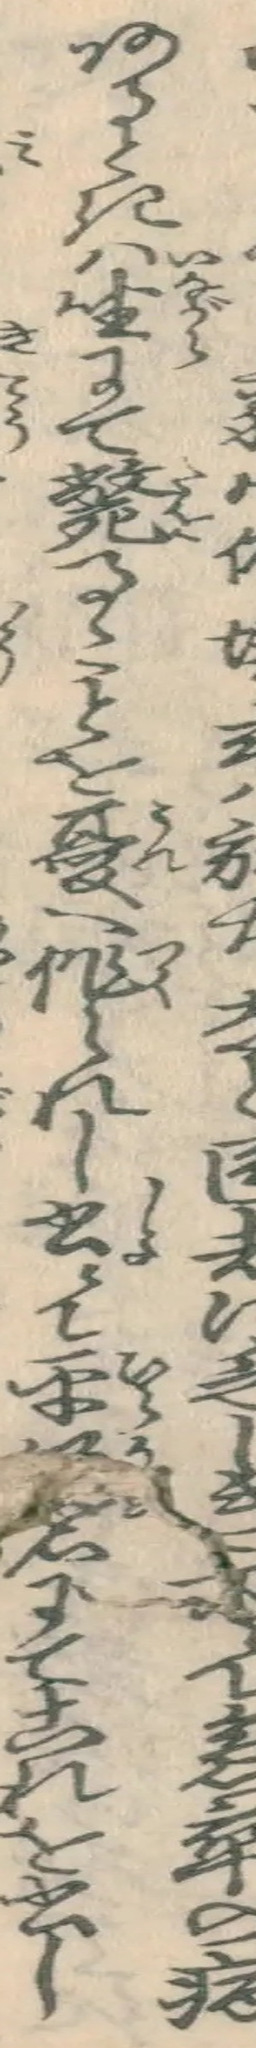あるときは坐にて斃るゝことを憂へ作られし書にて平仮名にてこれを出し
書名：経済をしへ草
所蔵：国立国会図書館 National Diet Library, JAPAN
